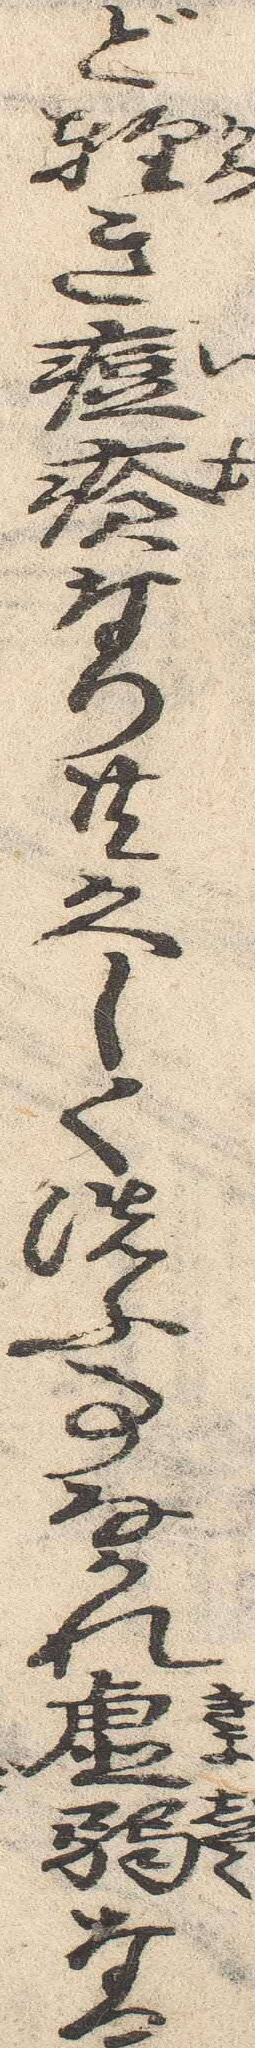ど軽き痘瘡なり共久しく洗ふ事なかれ虚弱なる
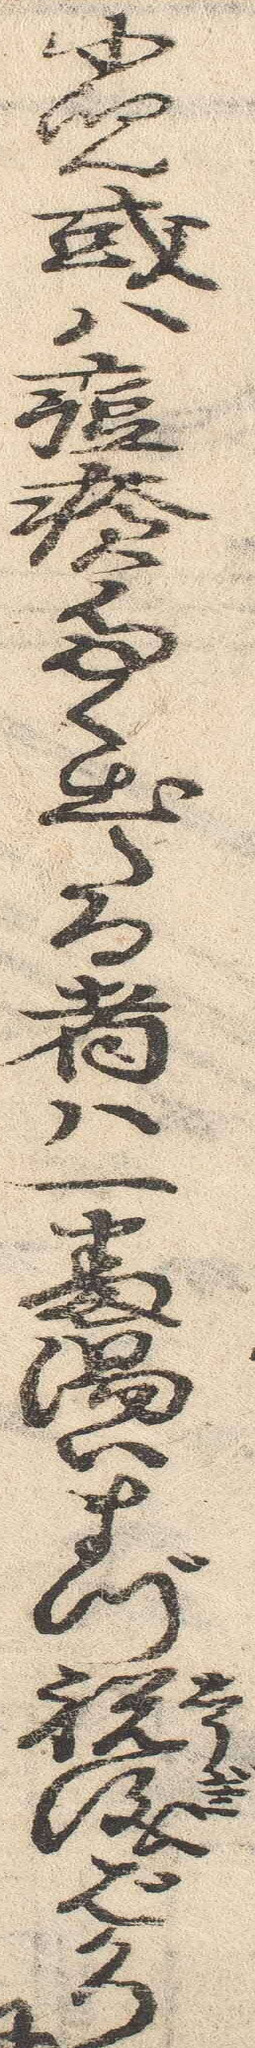小児或は痘瘡多く出たる者は一番湯はまづ祝儀ばかりに
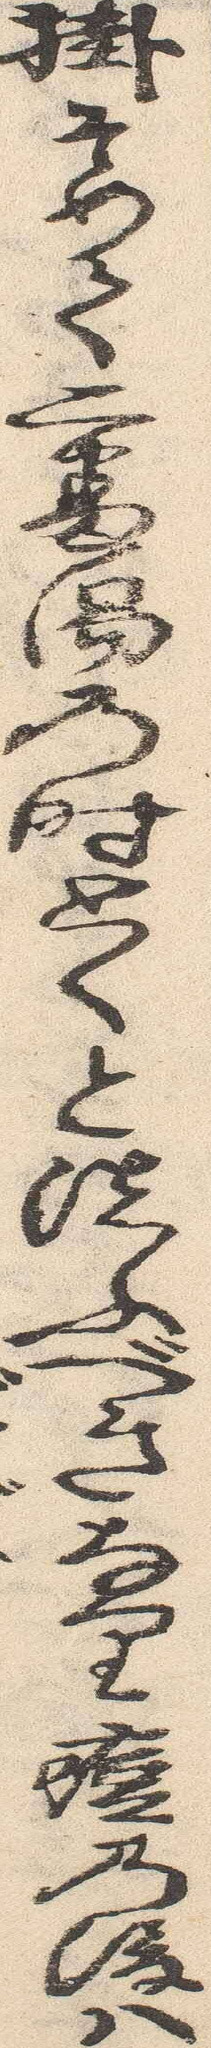掛そめて二番湯の時とくと洗ふべきなり痘の後は
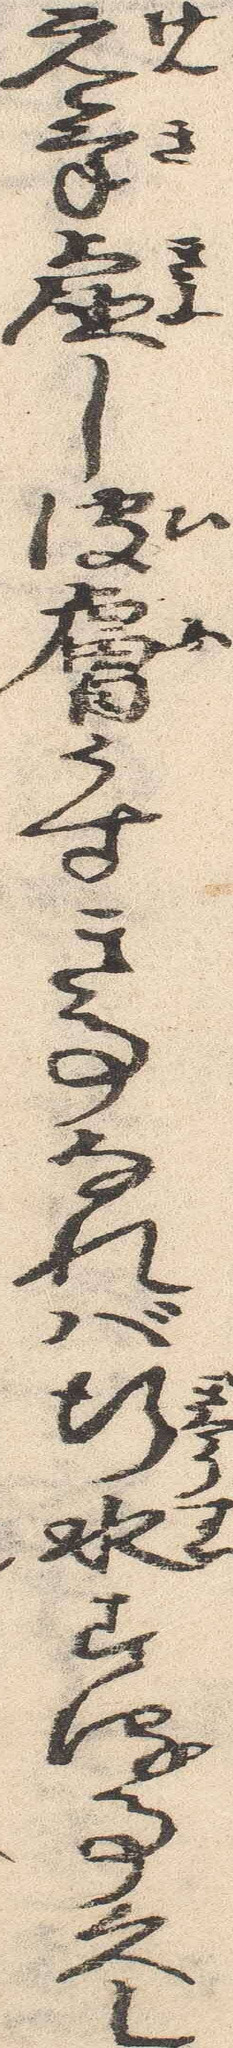元気虚し皮膚うすき事なれば行水する事久し
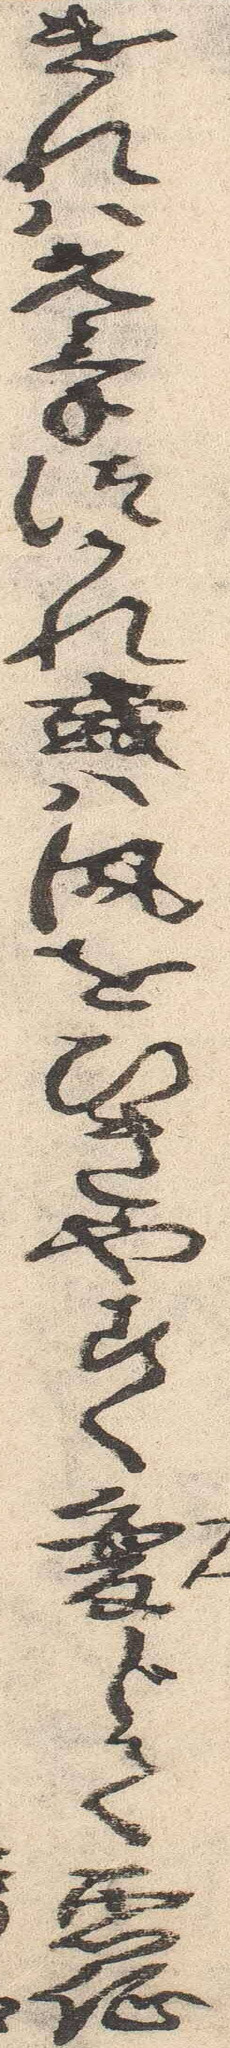けれは元気つかれ或は風をひきやすく変じて悪証
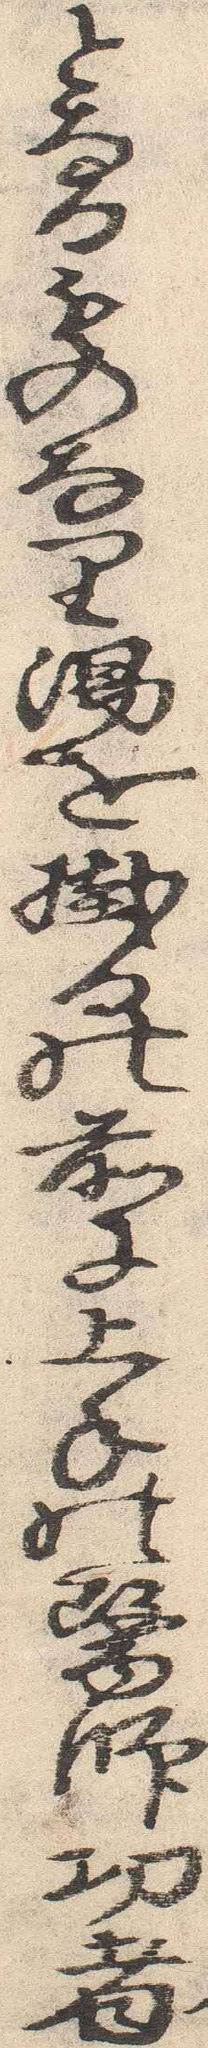となるものなり湯を掛るの前に上手の医師功者
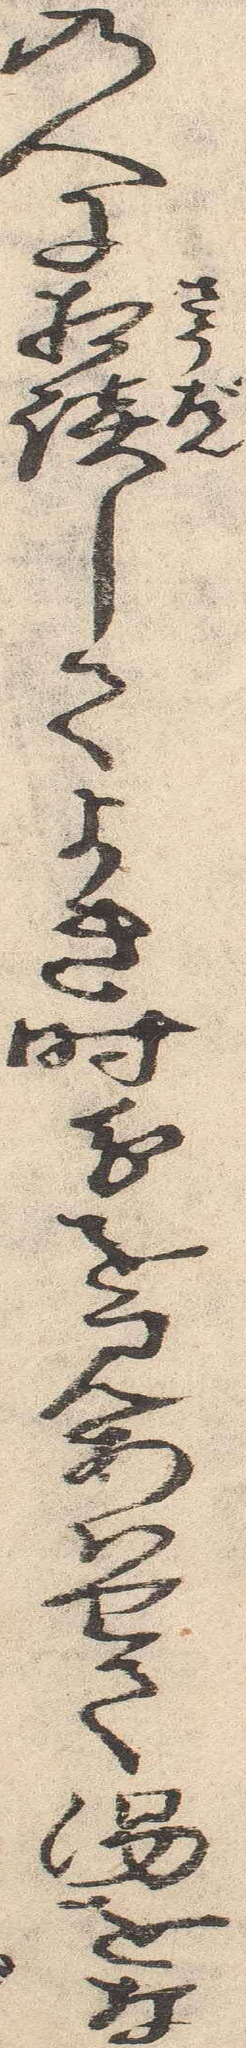の人に相談してよき時分を見あはせて湯をな
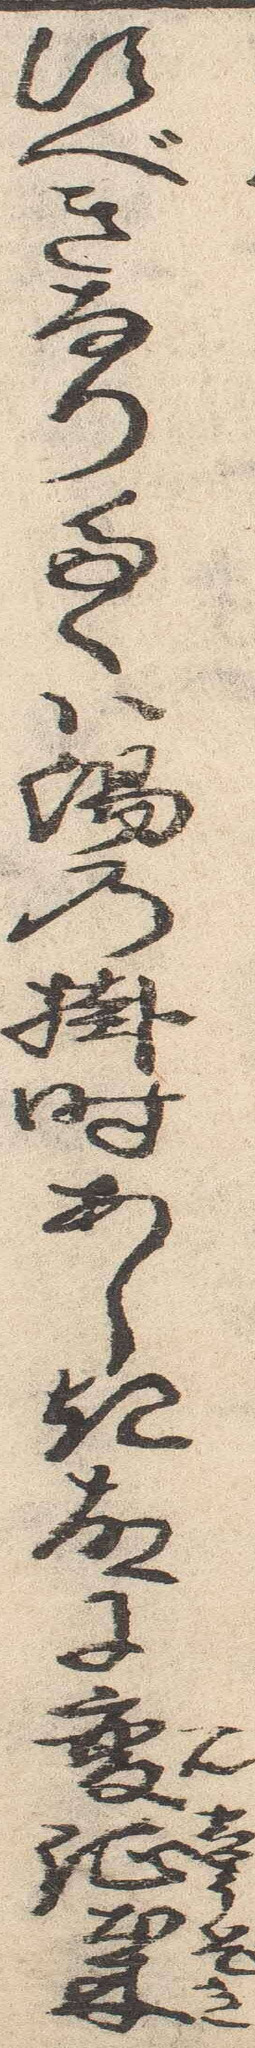すべきなり多くは湯の掛時あしき故に変証出来
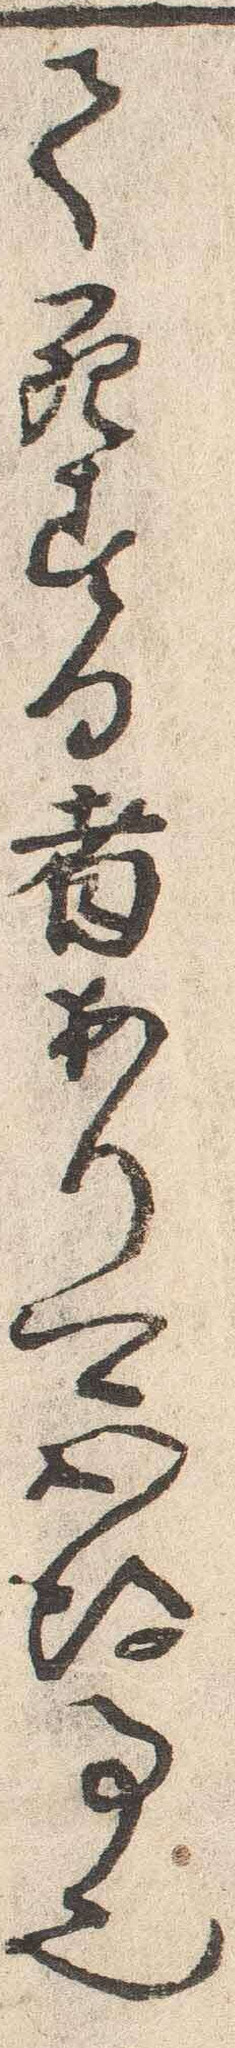て死する者あり可心得事也
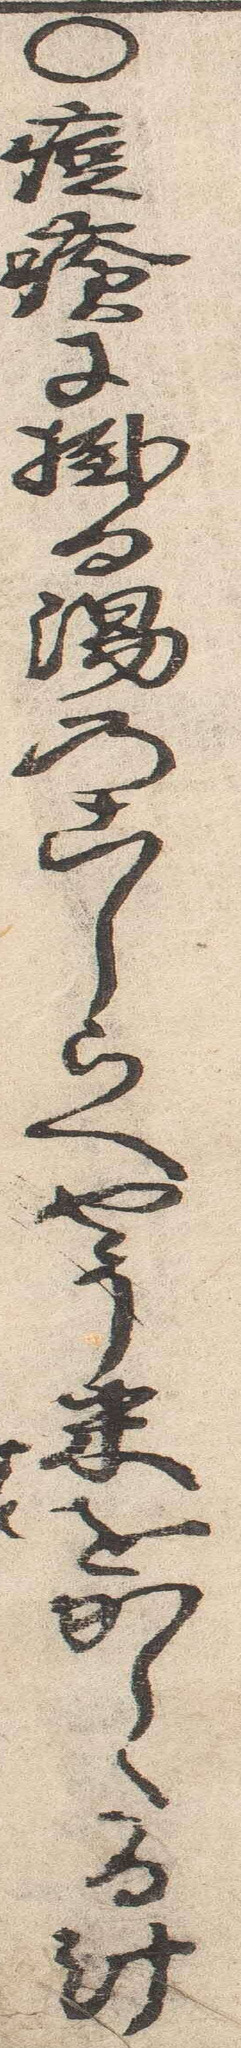○痘瘡に掛る湯のこしらへやう米をかしたる汁
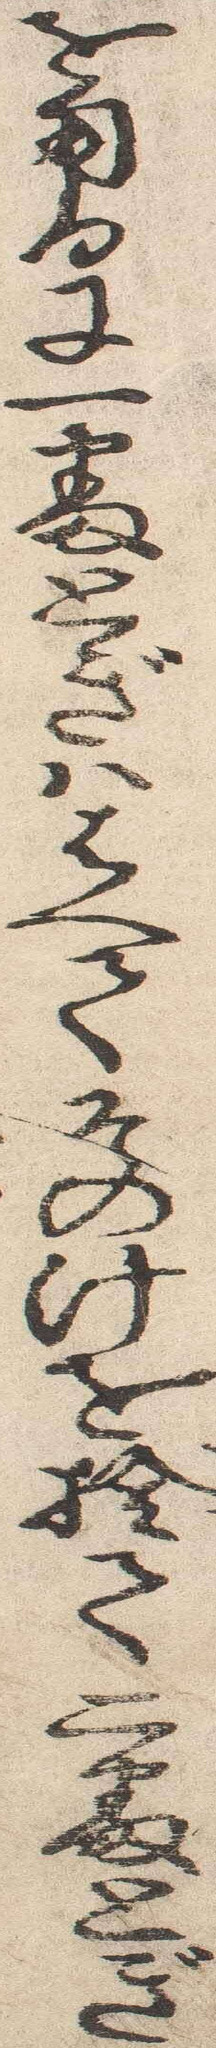を用るに一番とぎははへてその汁を捨て二番とぎ
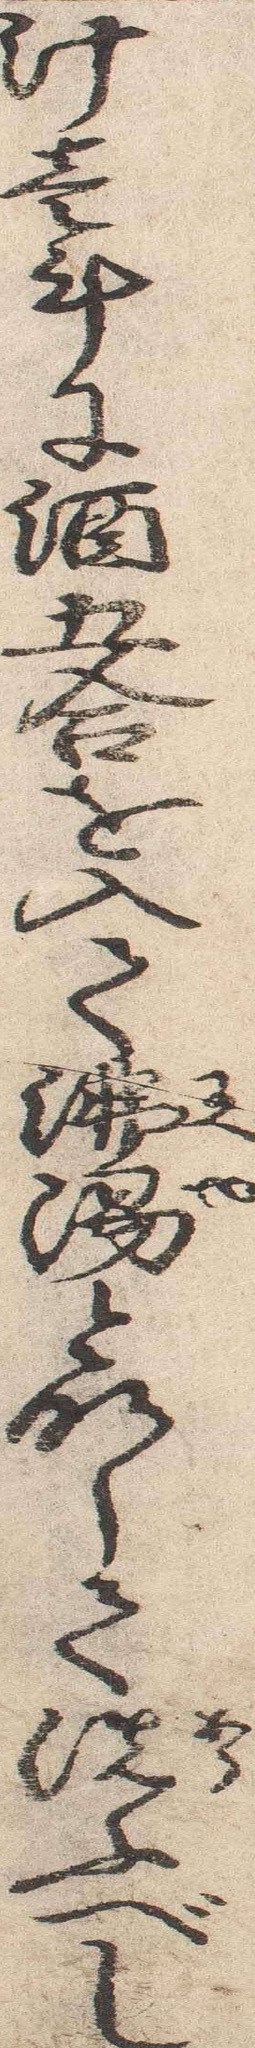汁壱斗に酒五合を入て沸湯となして洗ふべし
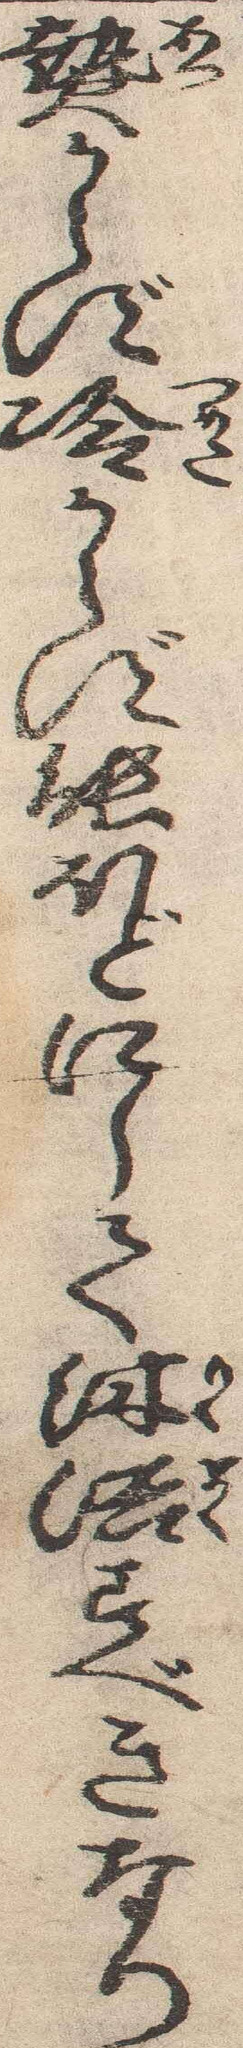熱からず冷からず能ほどにして沐浴すべきなり

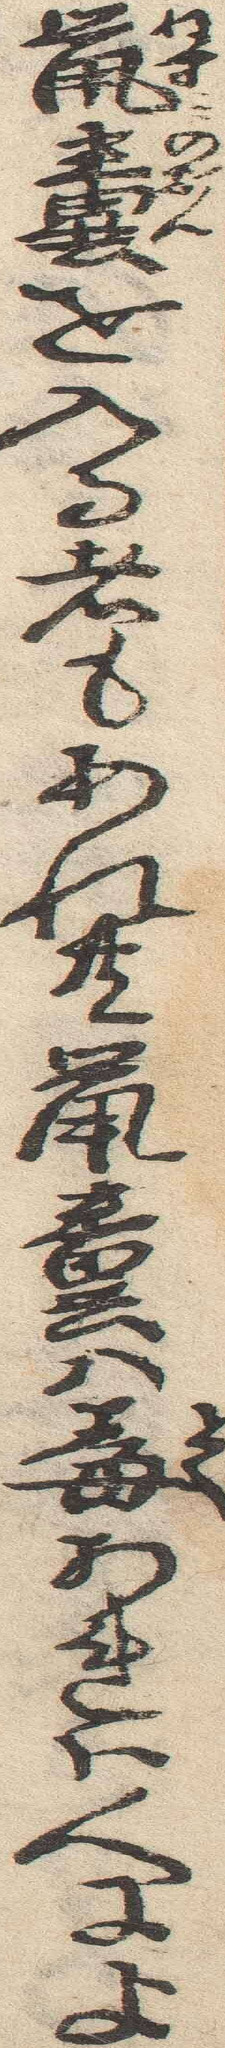鼠糞を入る者もあれ共鼠糞は毒あれは人によ
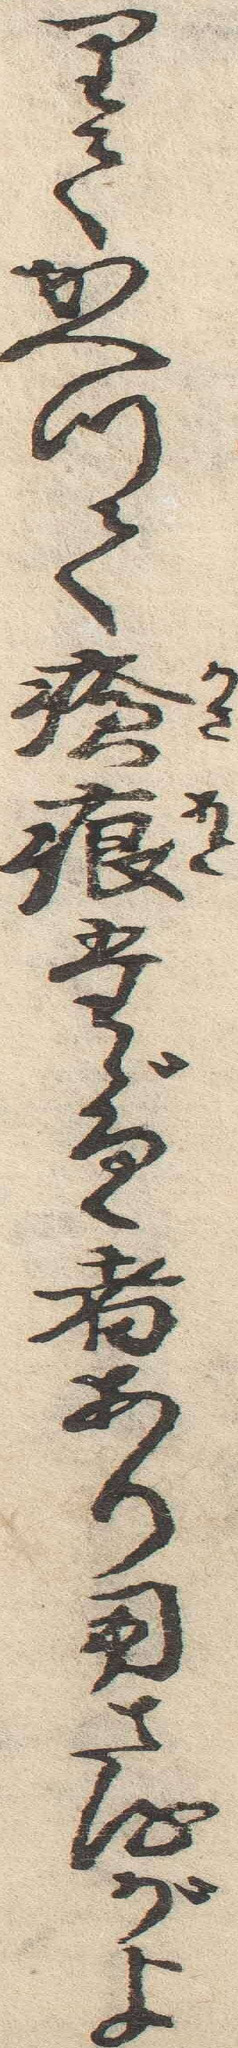りてかへつて瘡痕たゞるゝ者あり用さるがよ
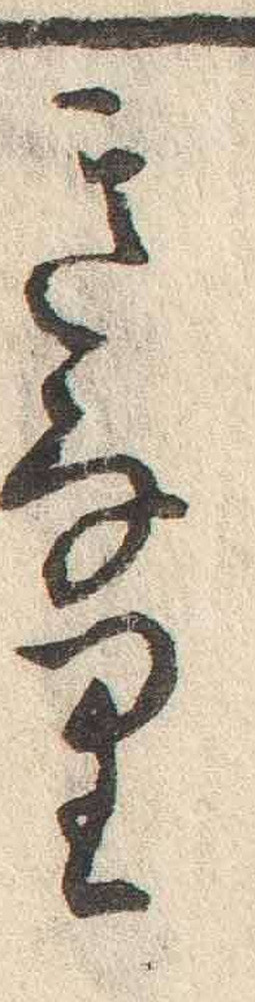きなり
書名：小児必用養育草
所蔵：東京学芸大学附属図書館 国文学研究資料館
